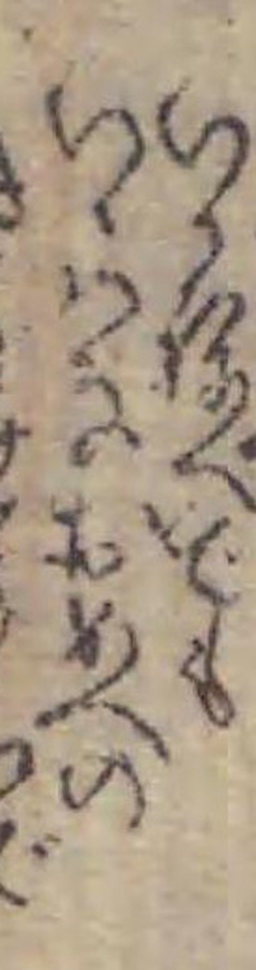いゝはなおめへの
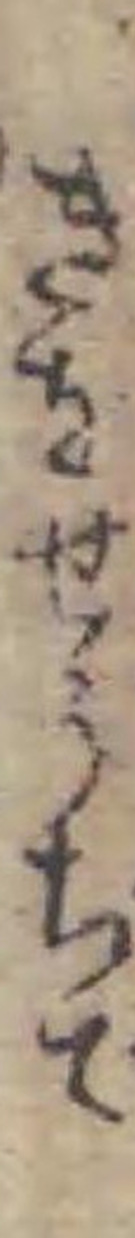きをせうちで
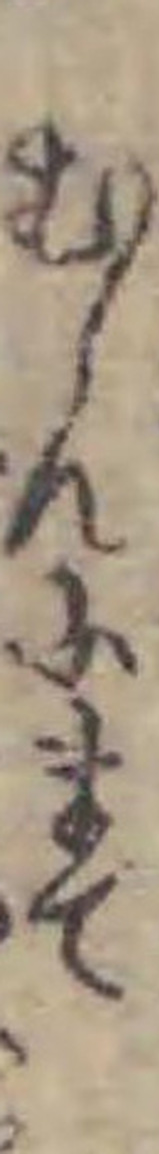むしんにまて
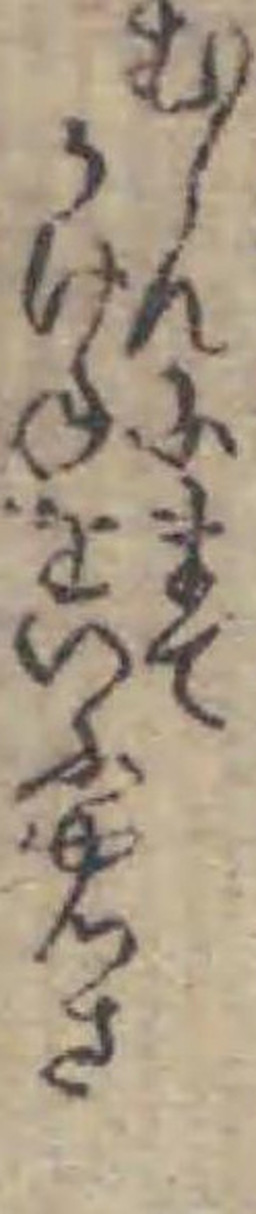かけねをいふやつさ
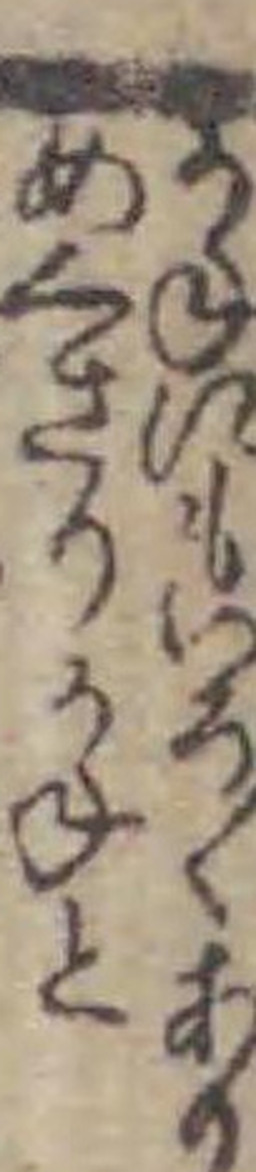めくさりかねと
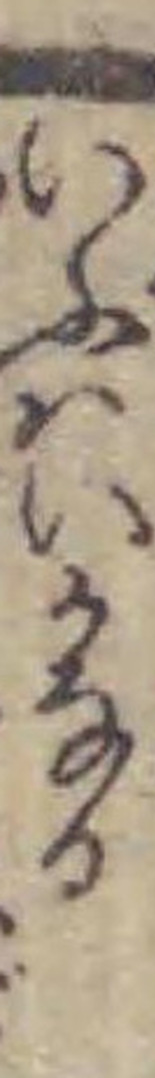いふはいかなる
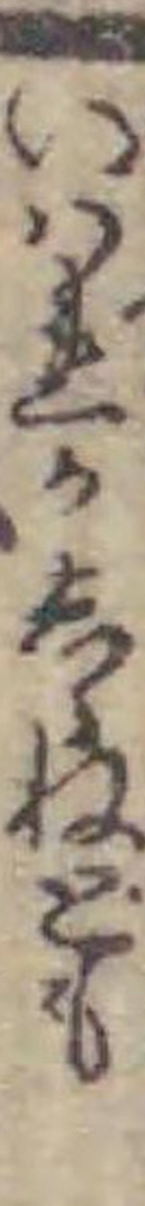いはれかしらねども
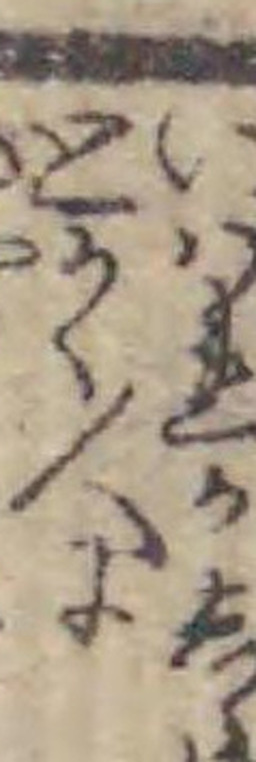とかく人に
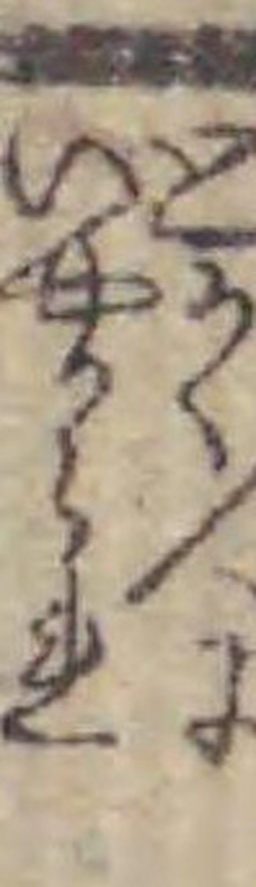いやかられ
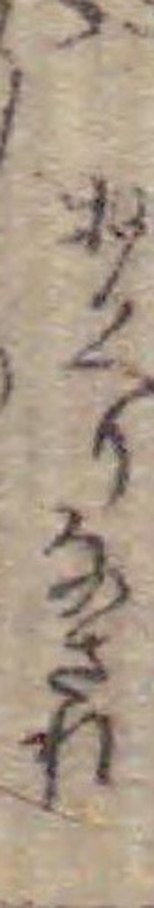おかへりなされ
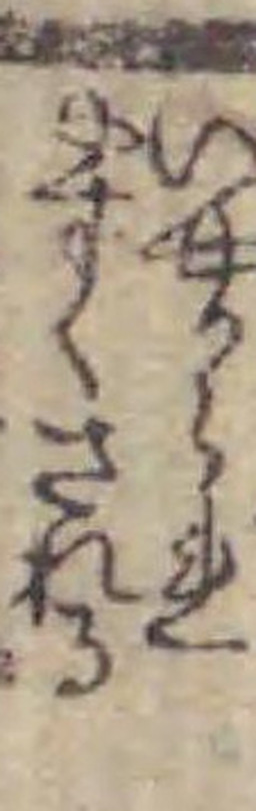やすくされる
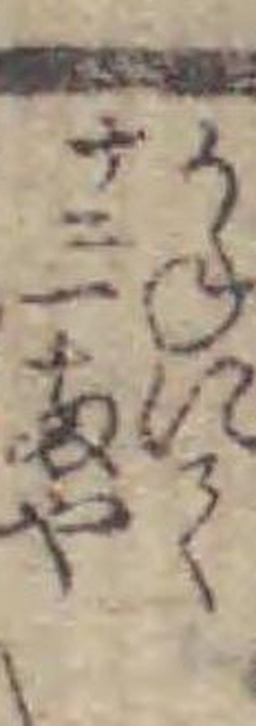ナニ一両や
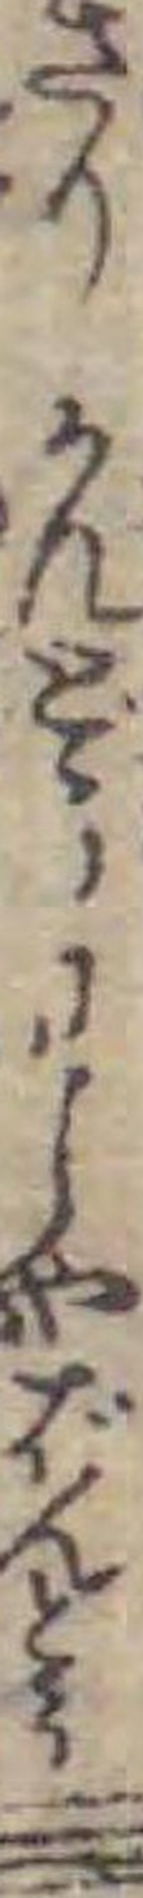かんどうわしやばんとう
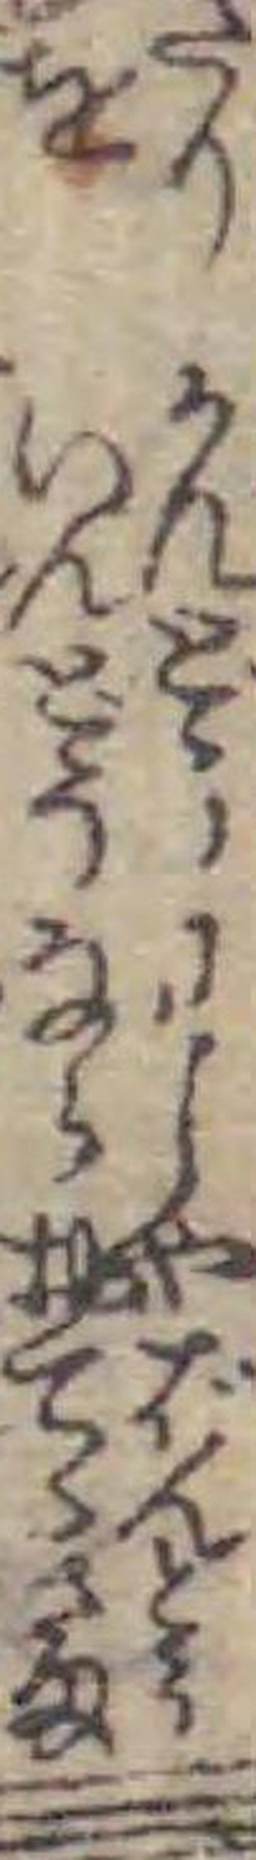いんどうならおてらさま
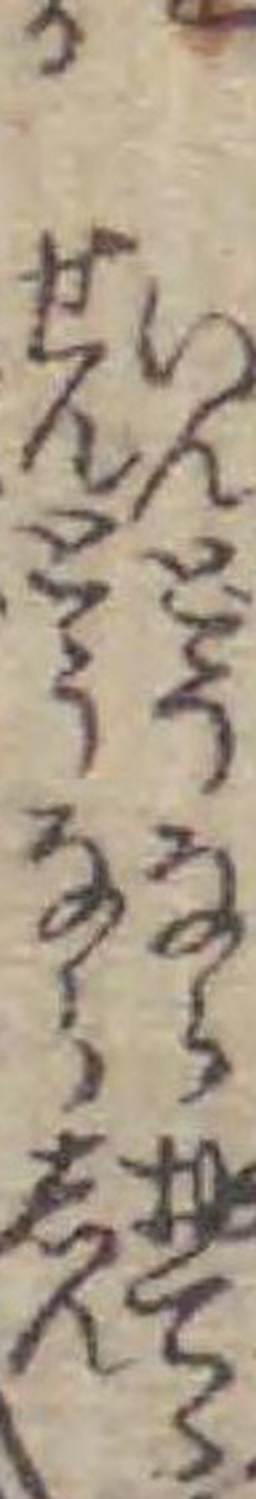せんとうならしん
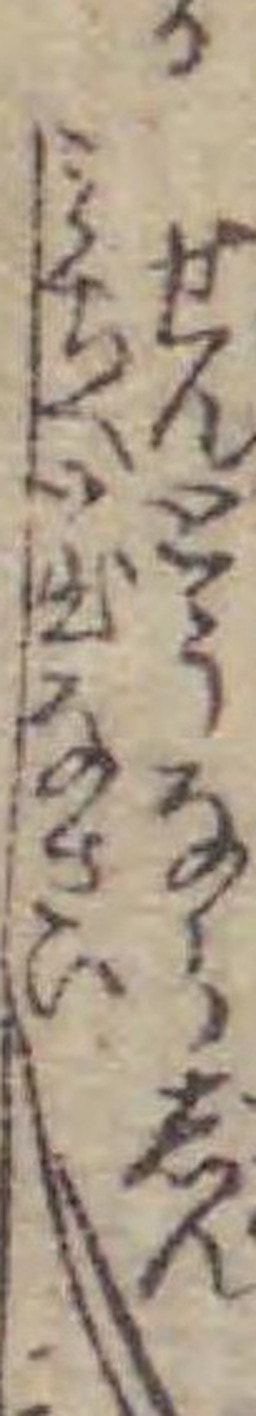みちへ御出なさい
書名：新鋳小判 : 3巻
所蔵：国立国会図書館 National Diet Library, JAPAN
